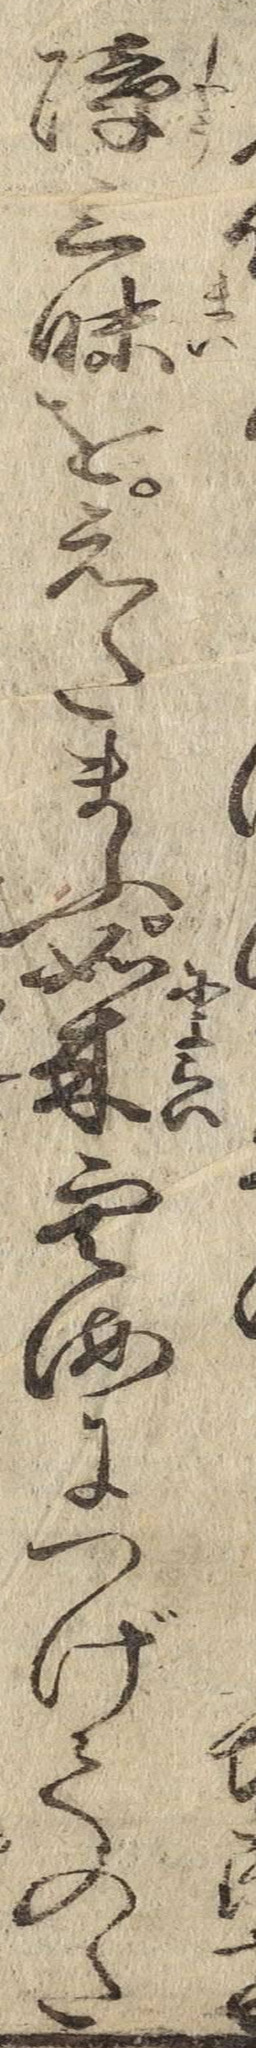障三昧をえたまふ。如来空海につげてのた
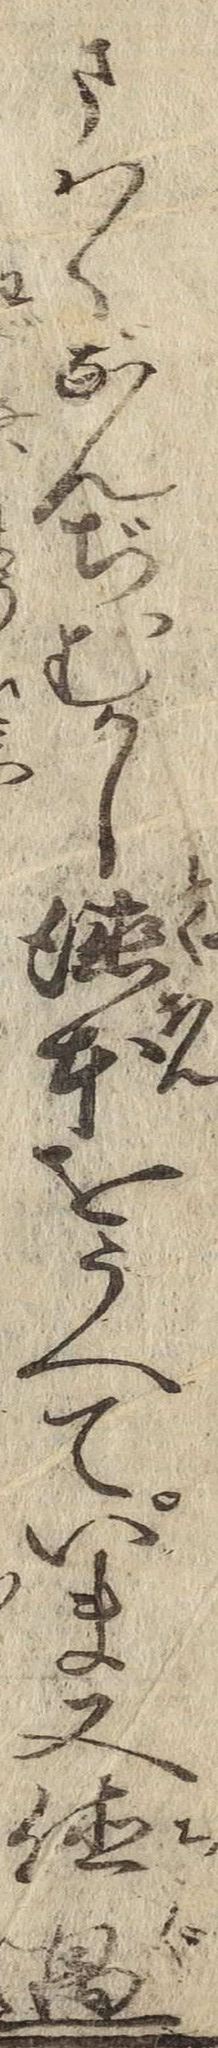まはくなんぢむかし徳本をうへて。いま又徳遇
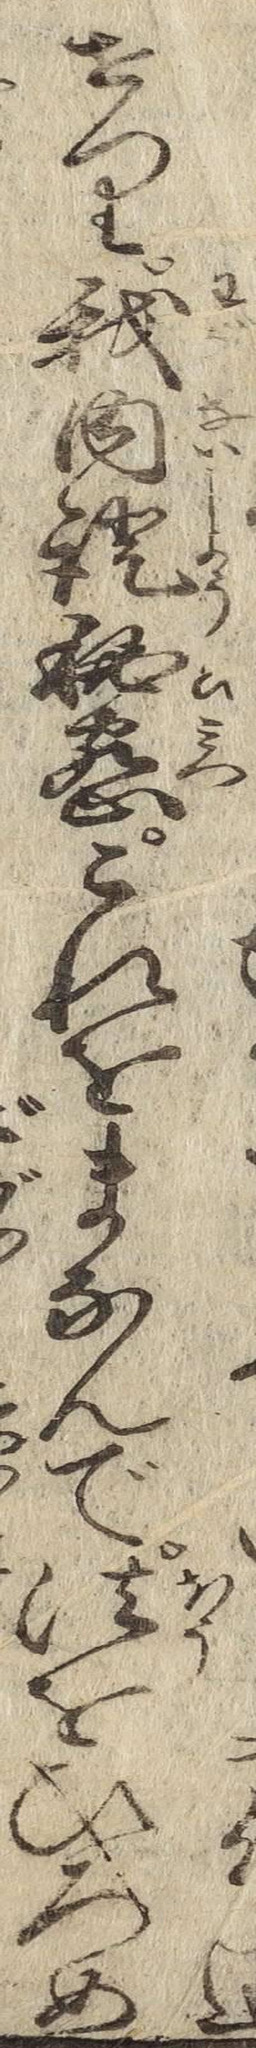せり。我内証秘密。これをまなんで法をひろめ
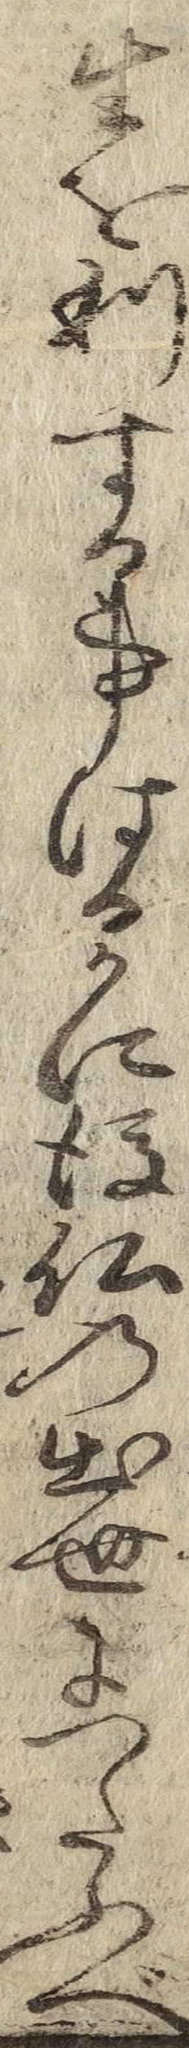生を利する事はるかに後仏の出世につたふべ
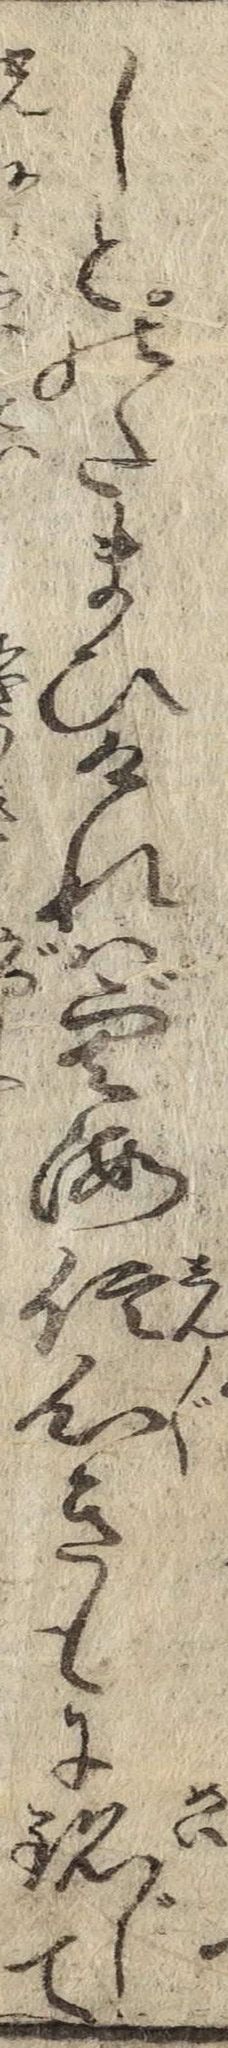しと。のたまひけれは。空海信心きもに銘じて
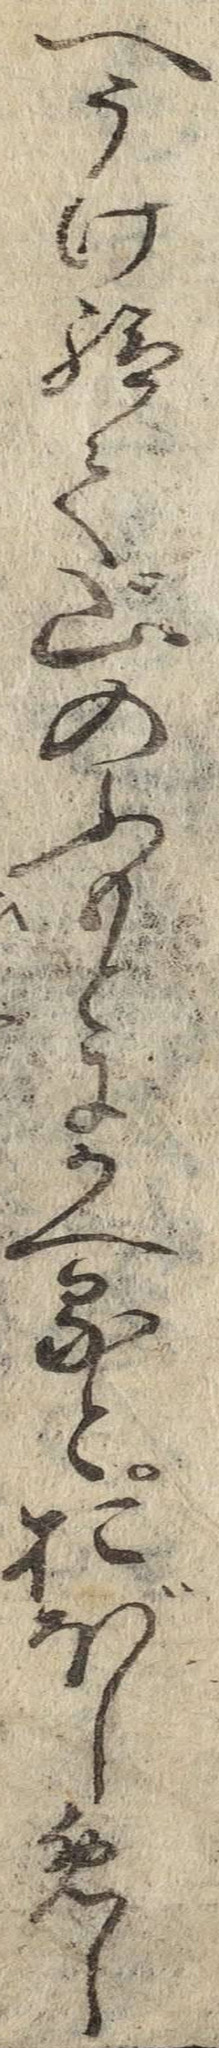へうけ給て。山のふもとにかへると。おぼしめし
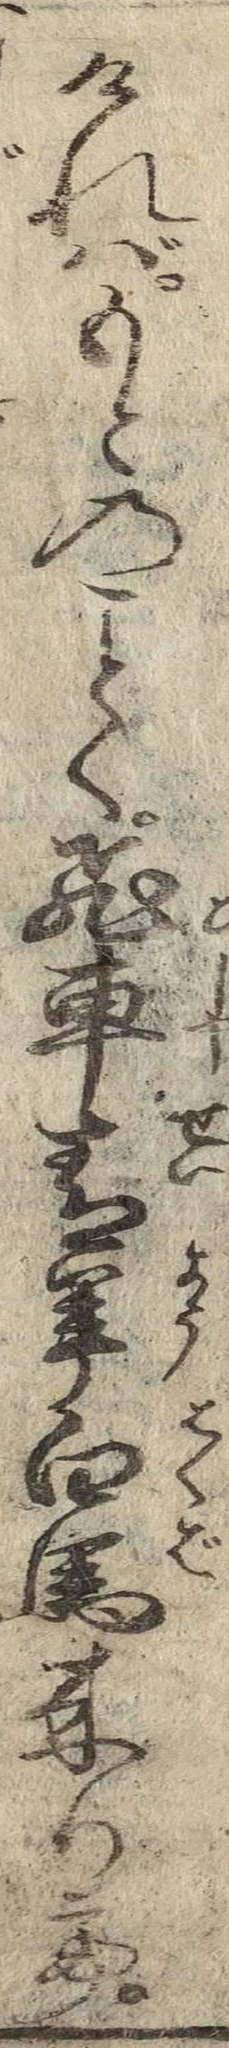ければ。もとのことく。飛車青羊白馬来りて。
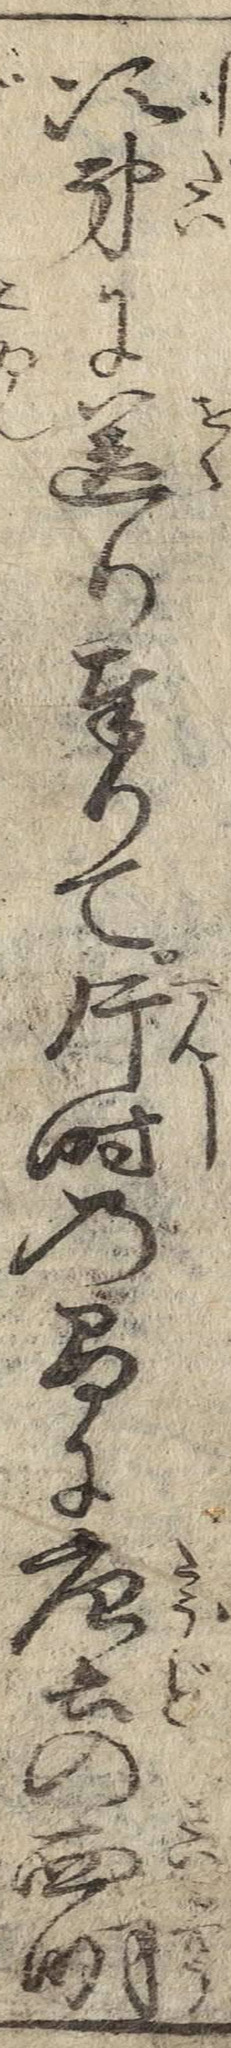次第に送り奉りて。片時の間に唐土の西明
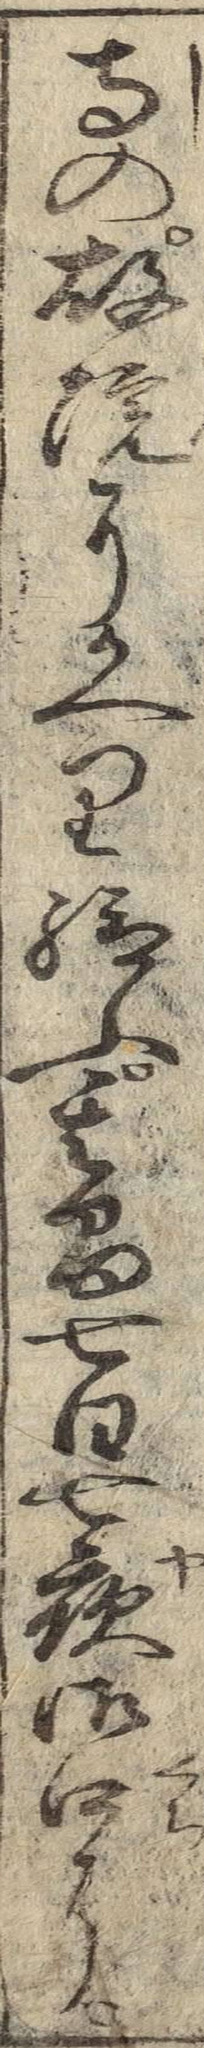寺の。故院にかへり給ふ。其間七日七夜御口に。

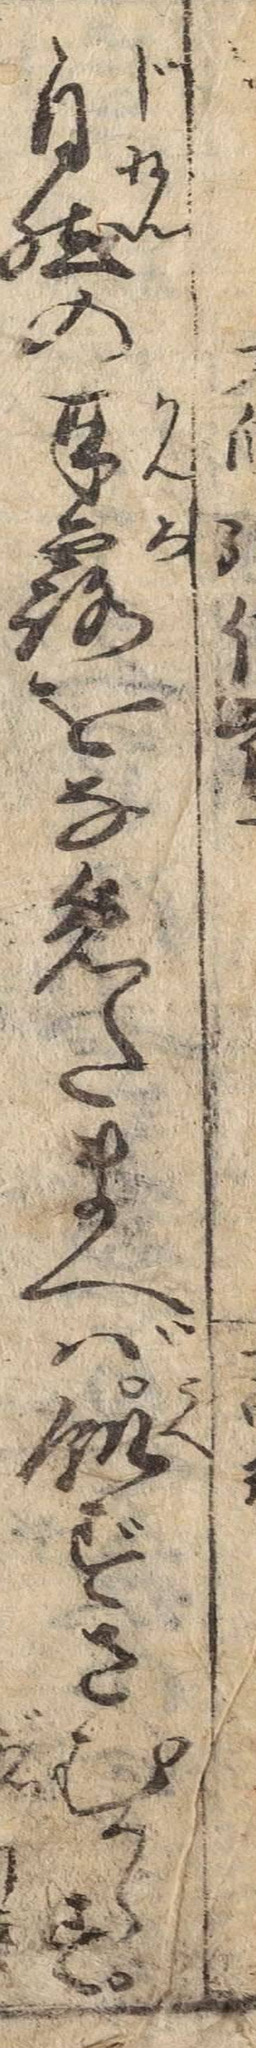自然の甘露をなめたまへば。餓ずさむからず。
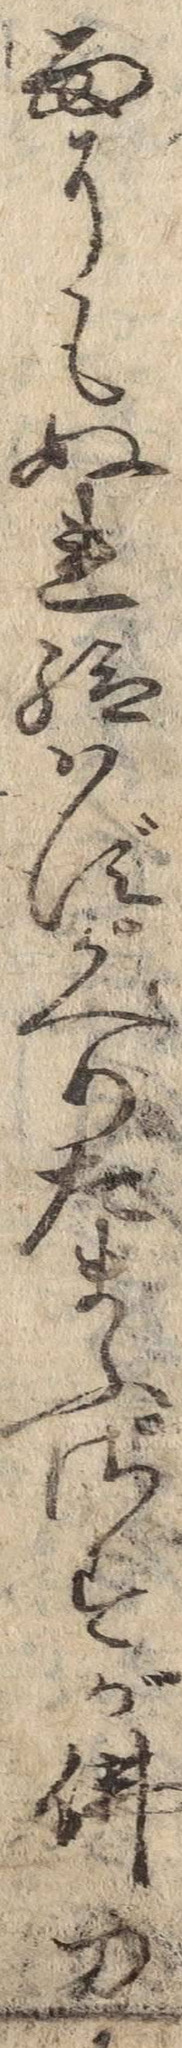雨にてもぬれ給はず。かへりたまふ。さすが仏力
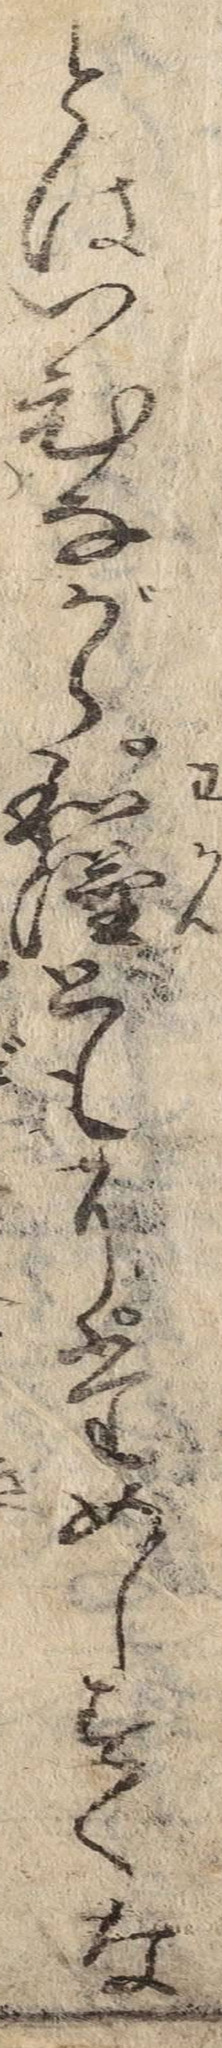とはいひながら。和漢ともに。ためしすくな
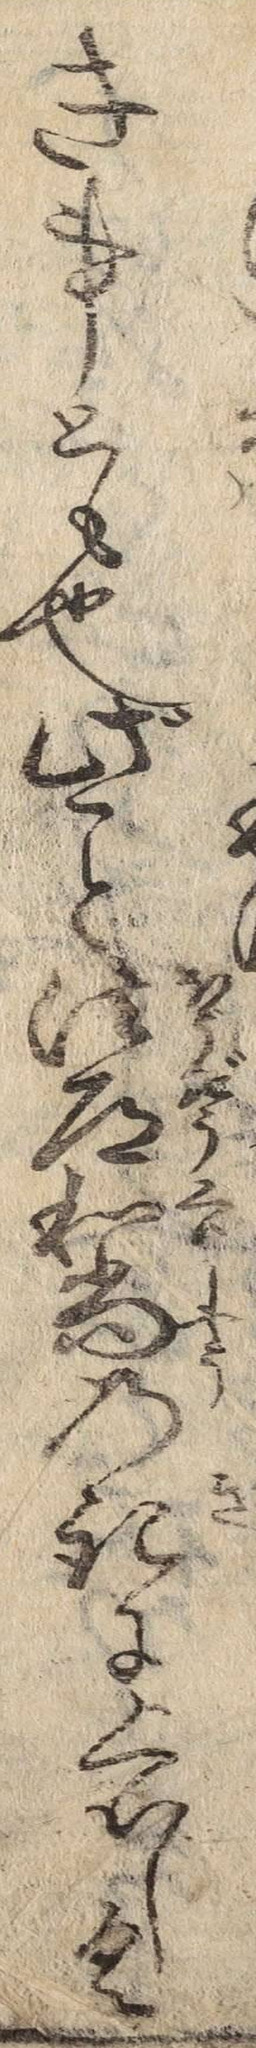き事とも也。此こと法道和尚の記にくはしく
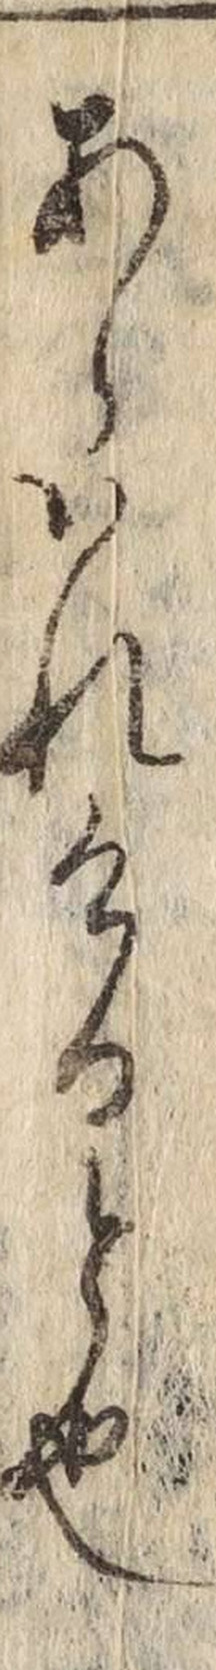あらはれけると也
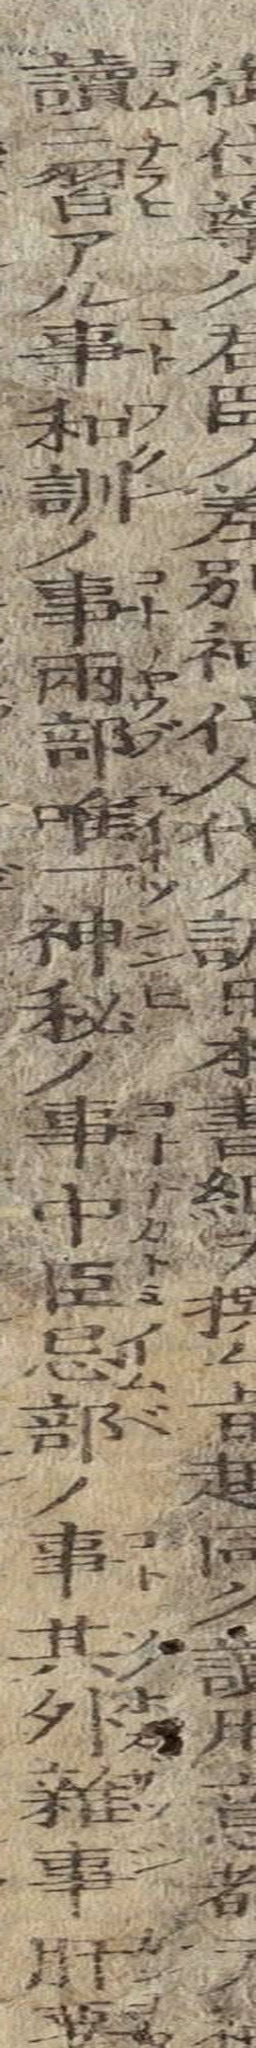読ニ習アル事和訓ノ事両部唯一神秘ノ事中臣忌部ノ事其外雑事肝要
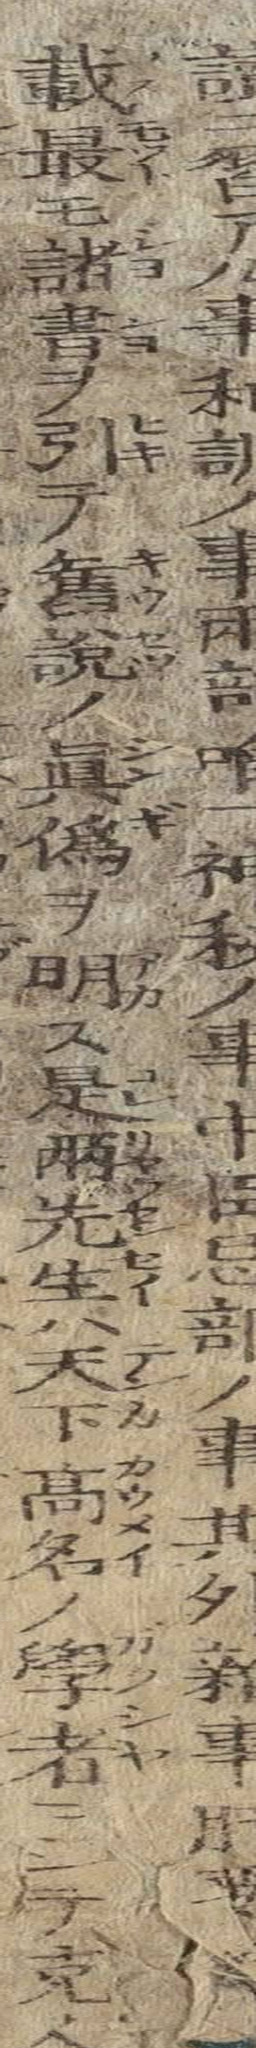載最モ諸書ヲ引テ旧説ノ真偽ヲ明ス是両先生ハ天下高名ノ学者ニシテ。克人
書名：弘法大師御傳記
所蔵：京都府立京都学・歴彩館 国文学研究資料館
